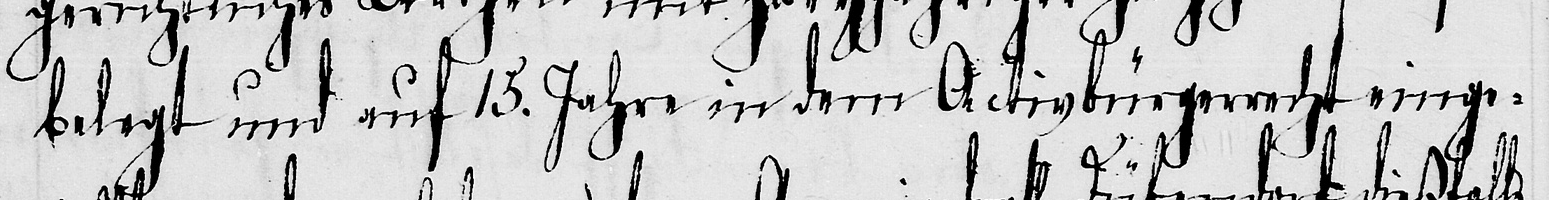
belegt und auf 15. Jahre in dem Activbürgerrcht einges¬
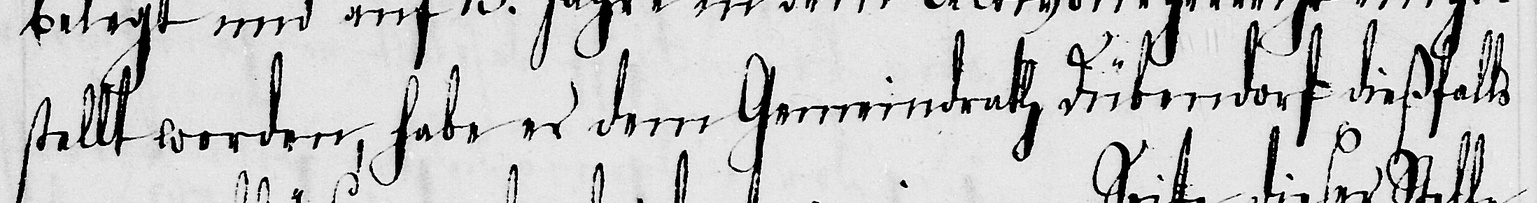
tellt worden, habe er dem Gemeindrath Dübendorf dießfalls
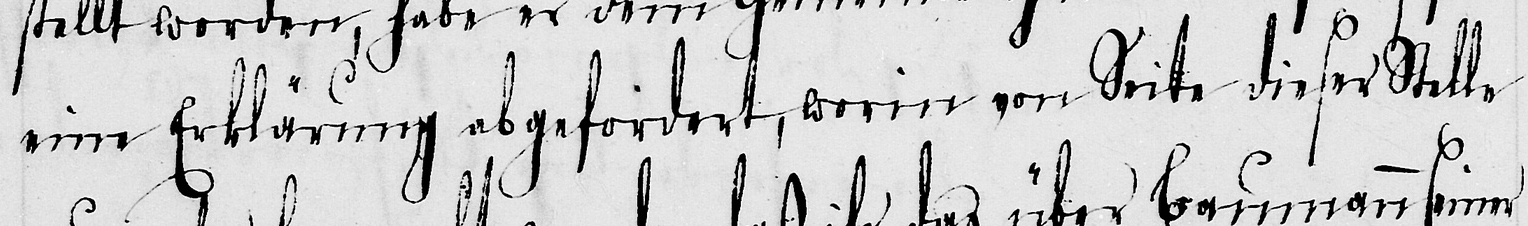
eine Erklärung abgefordert, worin von Seite dieser Stelle
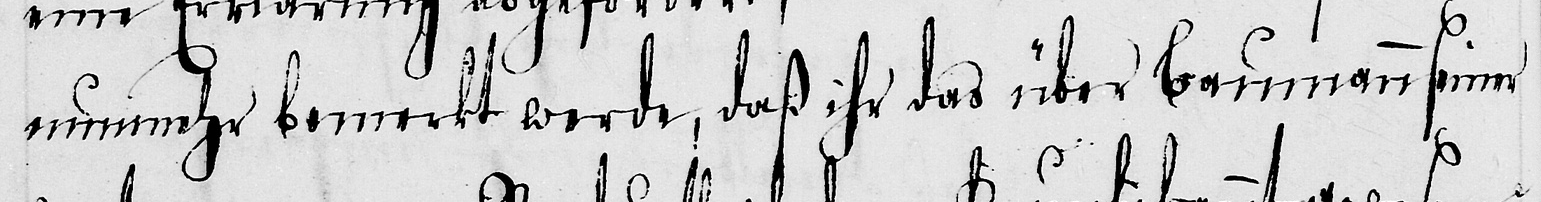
nunmehr bemerkt werde, daß ihr das über Baumann seiner
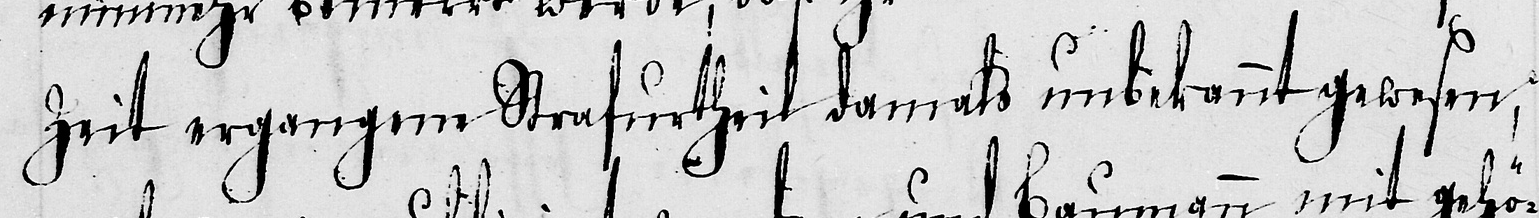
Zeit ergangene Strafurtheil damals unbekannt gewesen,
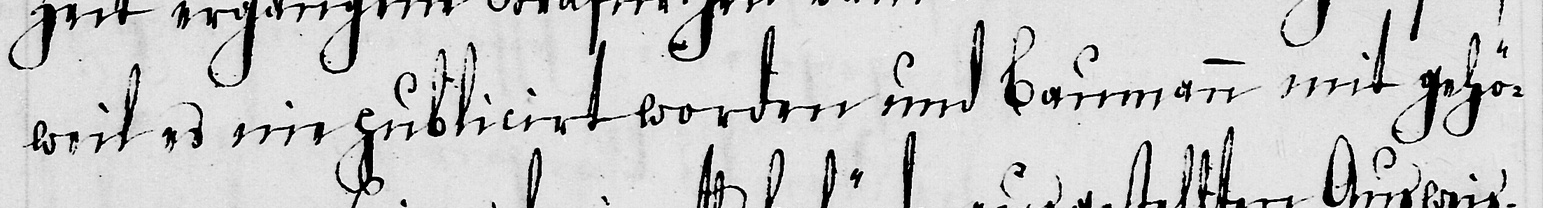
weil es nie publicirt worden und Baumann mit gehö¬
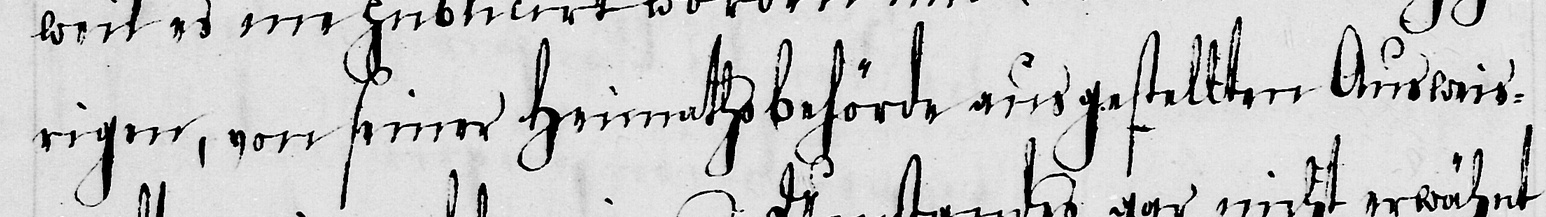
rigen, von seiner Heimathsbehörde ausgestellten Ausweis¬
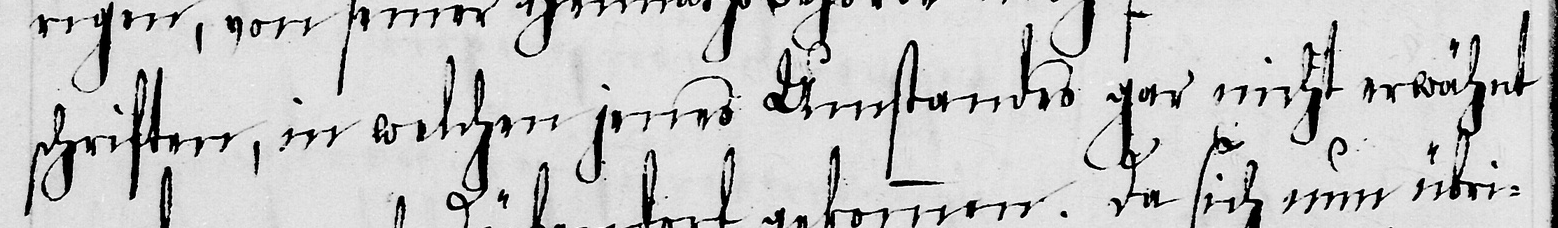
schriften, in welchen jenes Umstandes gar nicht erwähnt
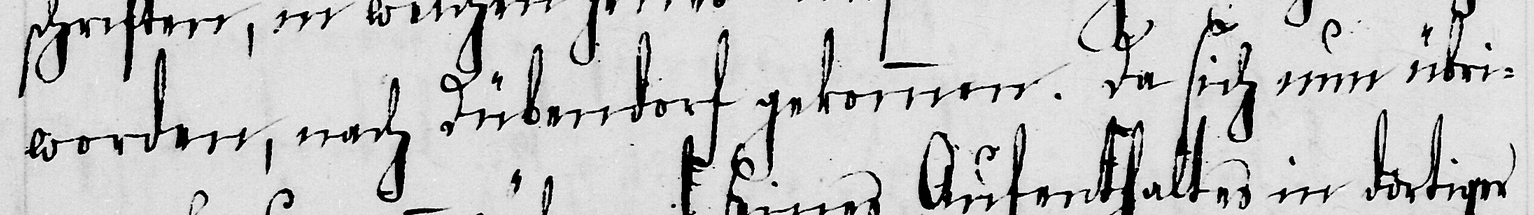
worden, nach Dübendorf gekommen. Da sich nun übri¬
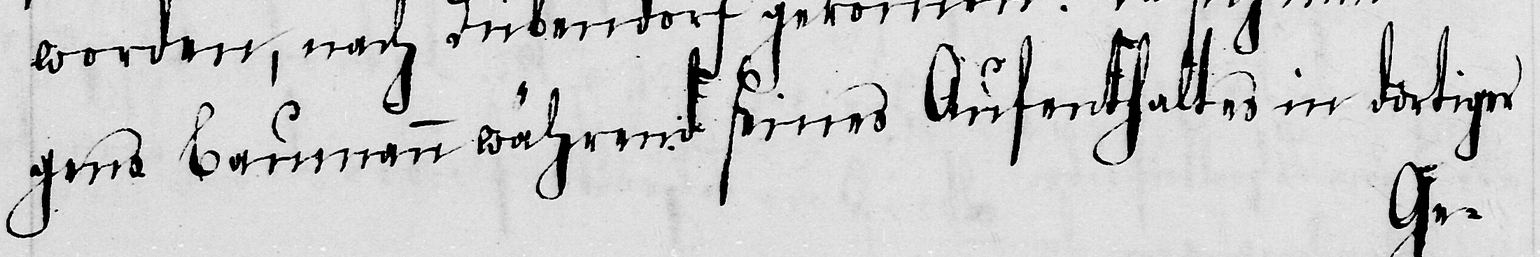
gens Baumann während seines Aufenthaltes in dortiger
